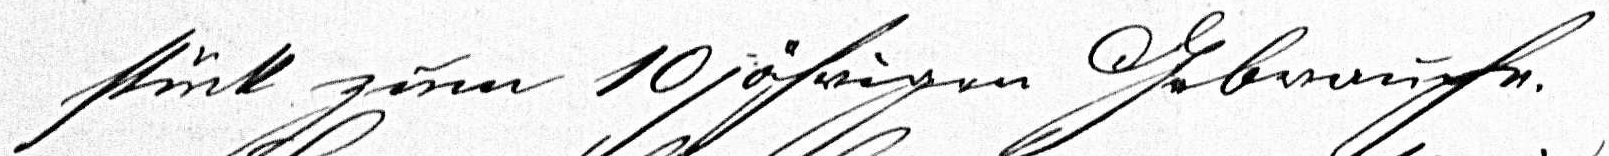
stück zum 10jährigen Gebrauche.
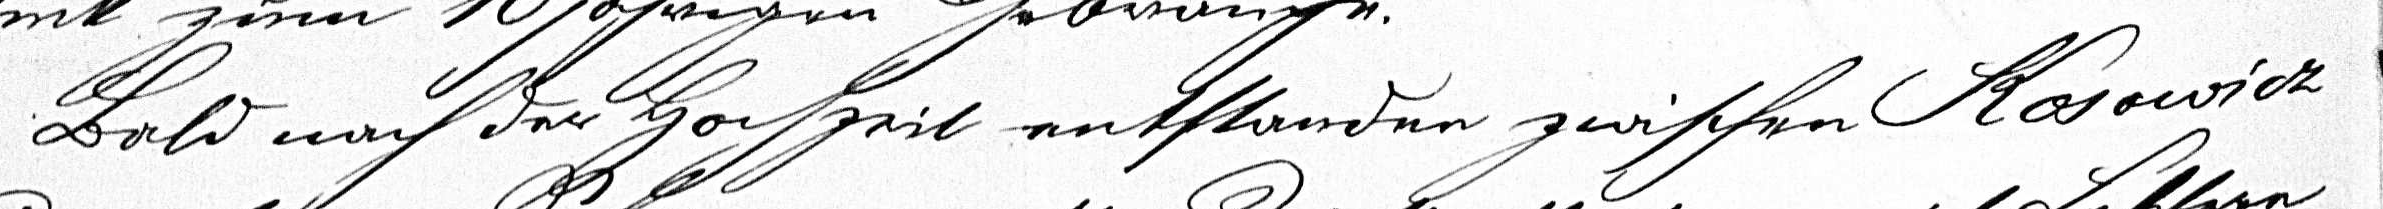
Bald nach der Hochzeit entstanden zwischen Kosowicz
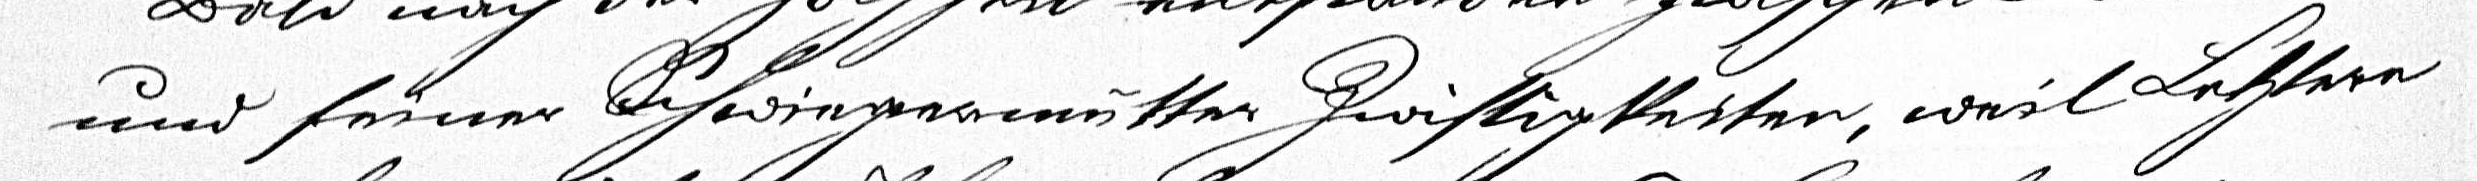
und seiner Schwiegermutter Zwistigkeiten, weil Letztere
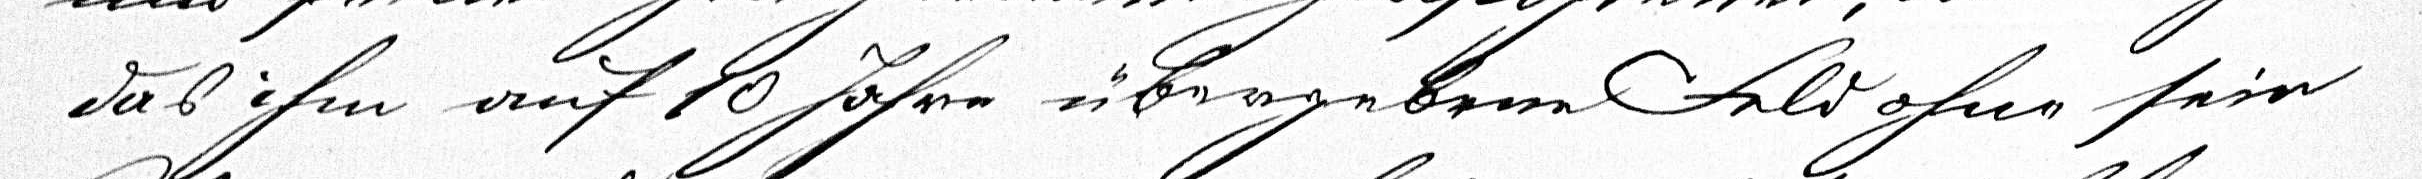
das ihm auf 10 Jahre übergebene Feld ohne sein
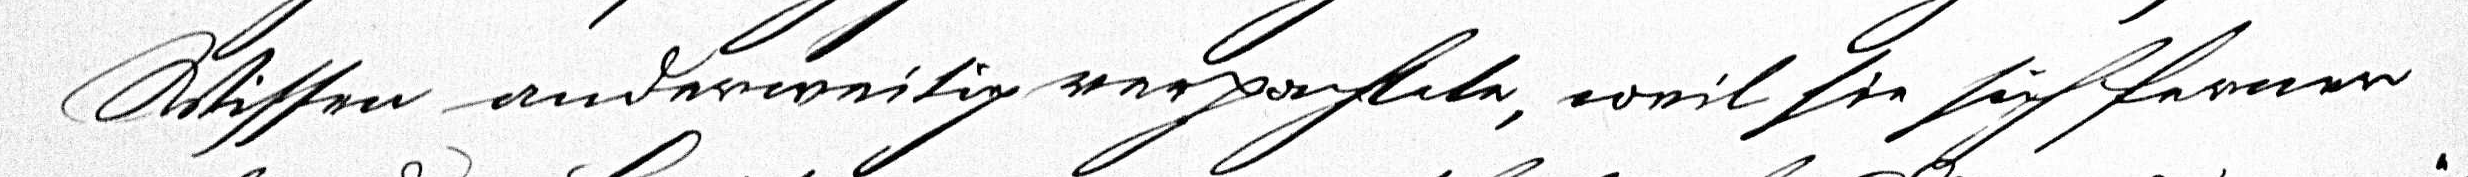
Wissen anderweitig verpachtete, weil sie sich ferner
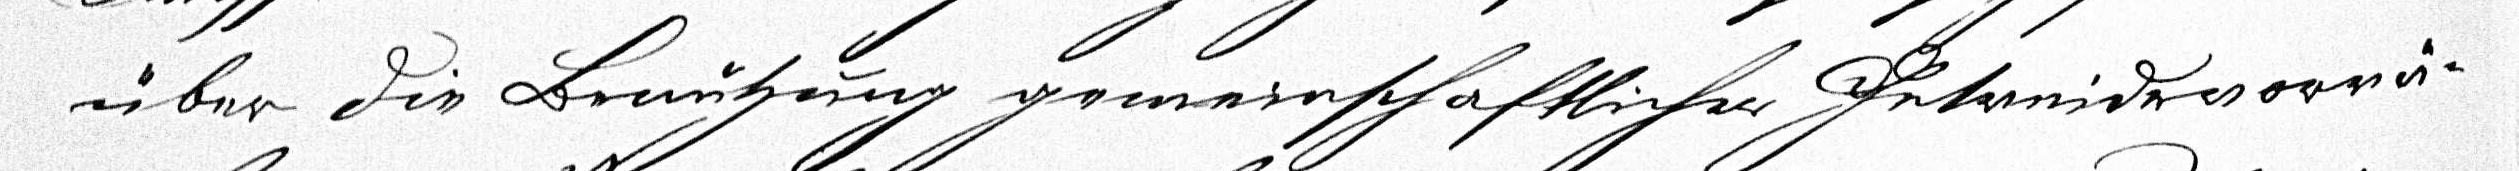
über die Benützung gemeinschaftlicher Getreidevorrä¬
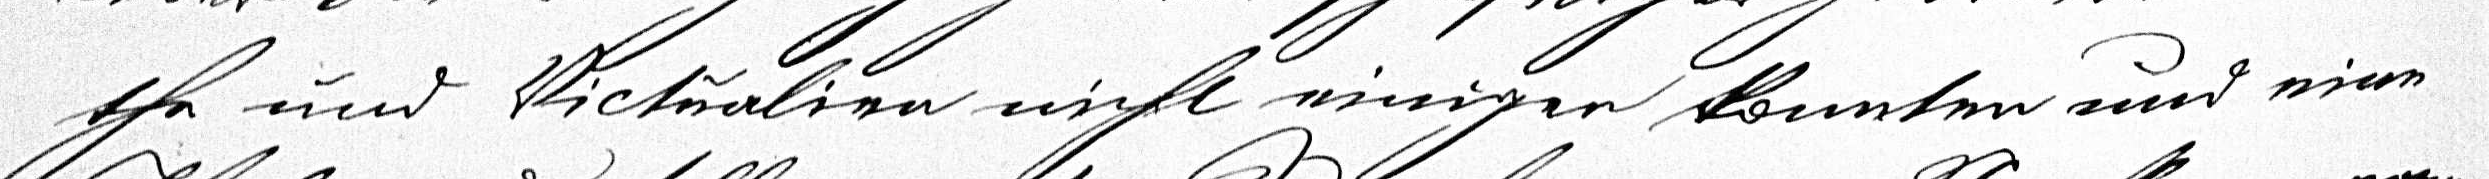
the und Victualien nicht einigen konnten und eine
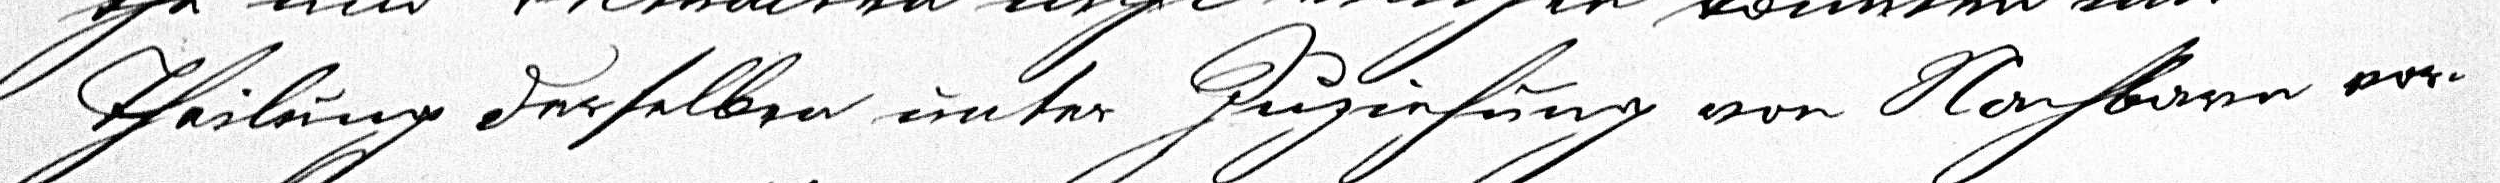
Theilung derselben unter Zuziehung von Nachbarn vor¬
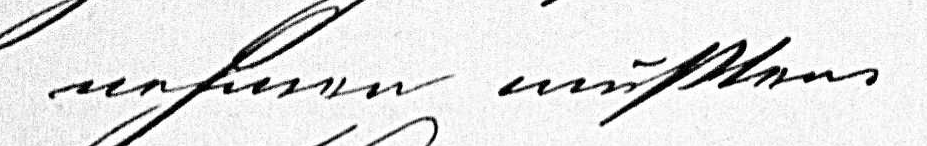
nehmen mußten.
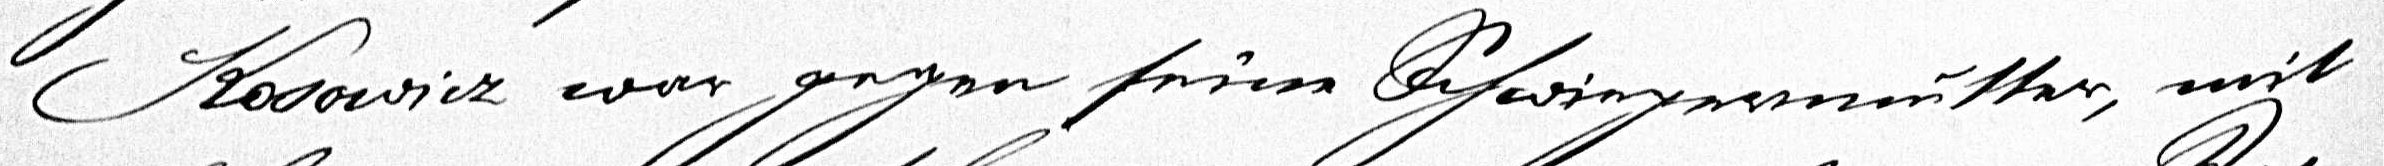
Kosowicz war gegen seine Schwiegermutter, mit
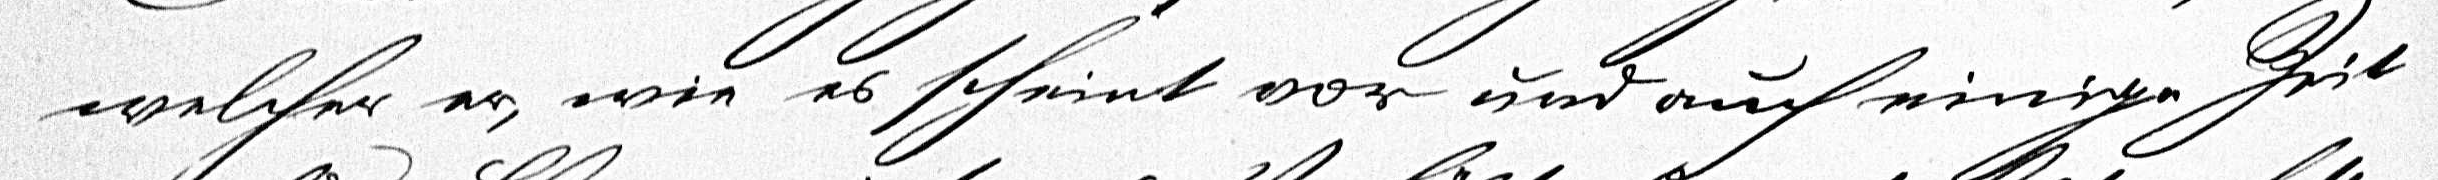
welcher er, wie es scheint vor und auch einige Zeit
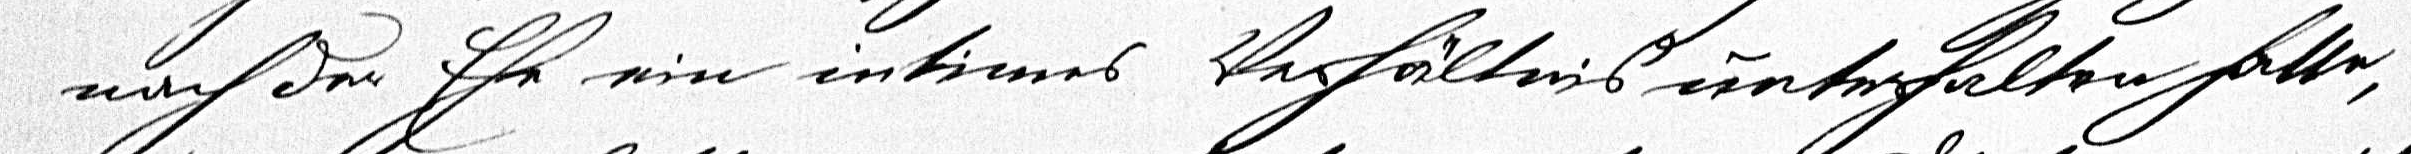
nach der Ehe ein intimes Verhältnis unterhalten hatte,
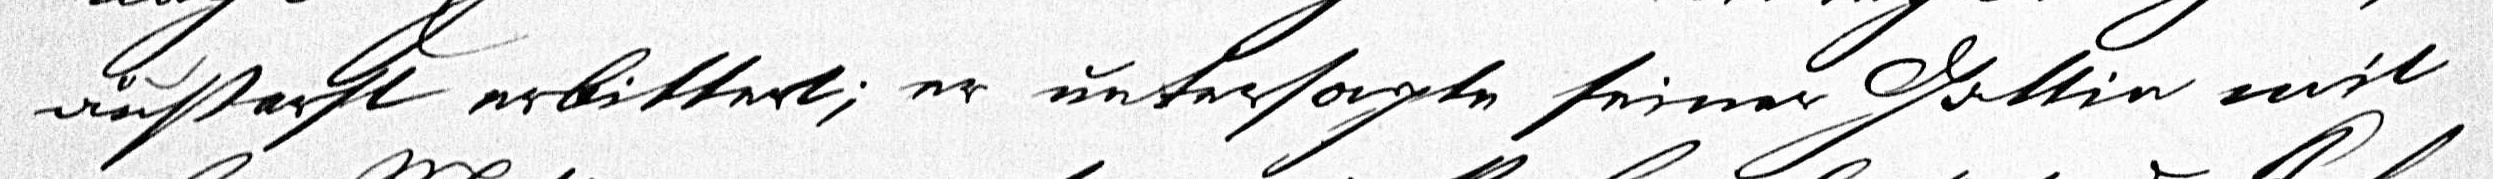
äußerst erbittert; er untersagte seiner Gattin mit
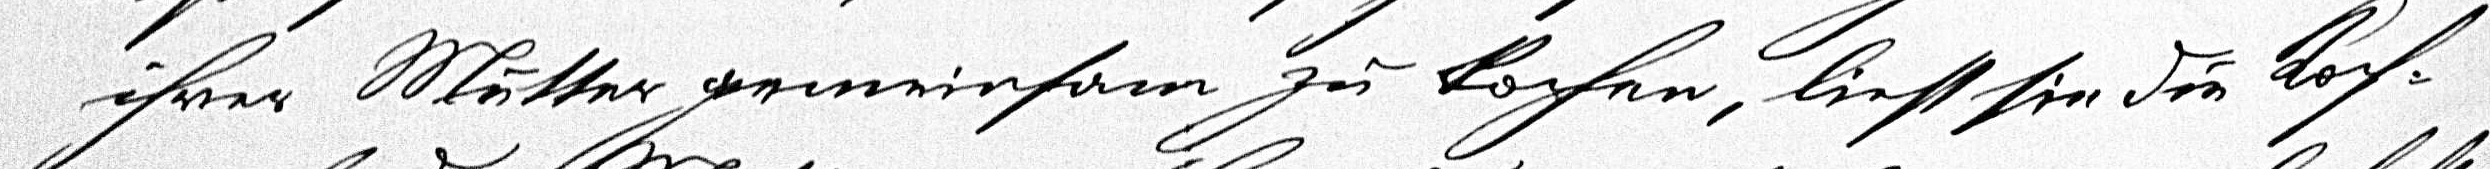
ihrer Mutter gemeinsam zu kochen, ließ sie die Koch¬
